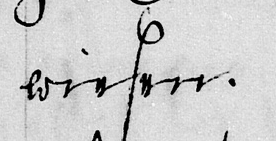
wiesen.
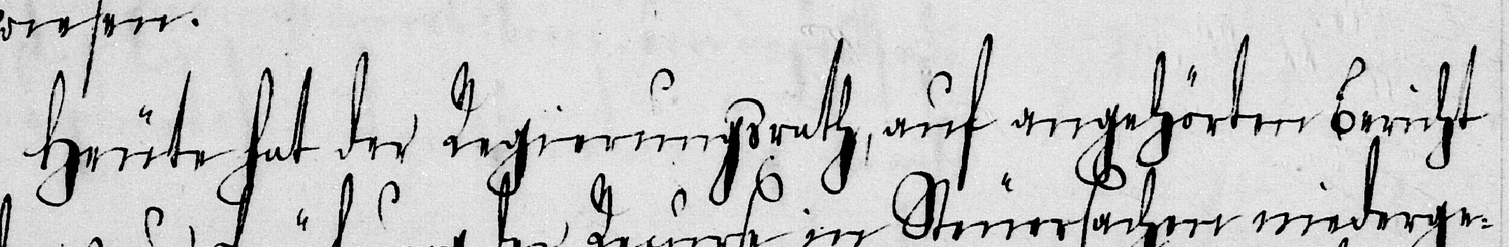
Heute hat der Regierungsrath, auf angehörten Bericht
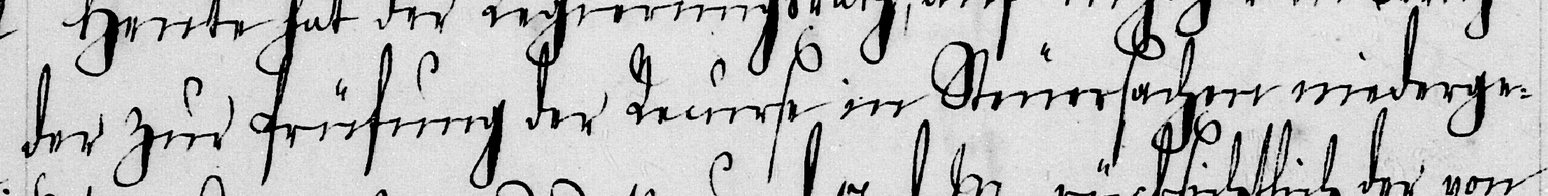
der zur Prüfung der Recurse in Steuersachen niederge¬
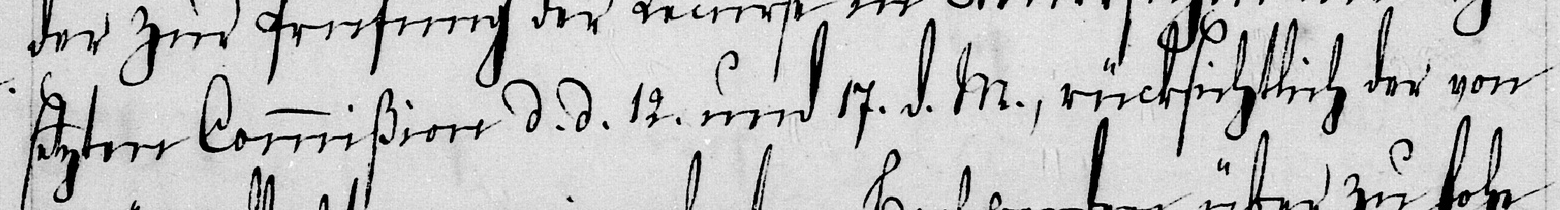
setzten Commißion d. d. 12. und 17. d. M., rücksichtlich der von
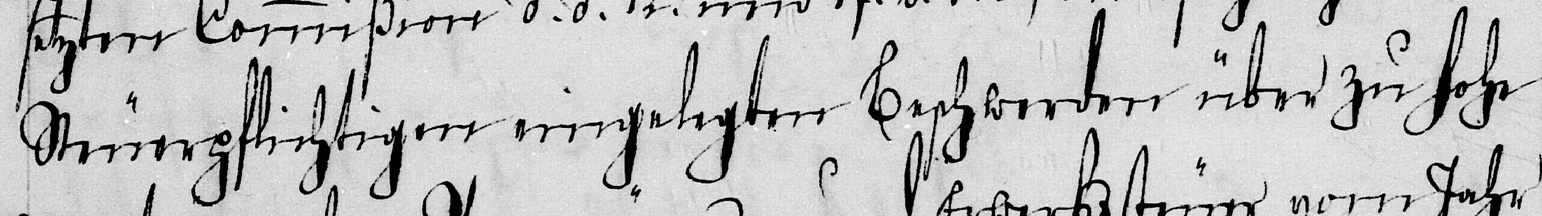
Steuerpflichtigen eingelegten Beschwerden über zu hohe
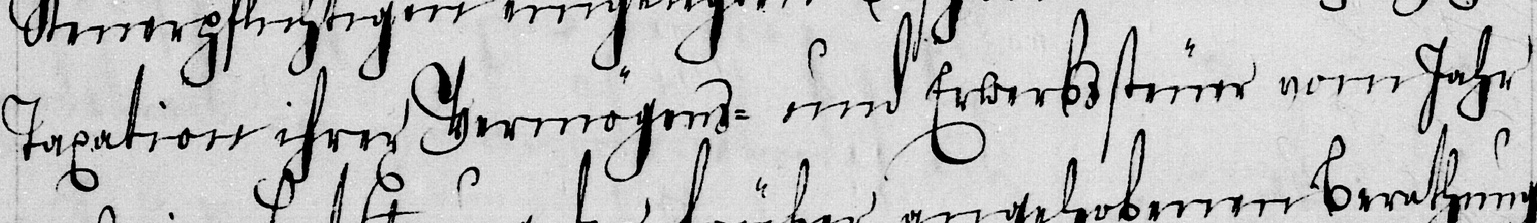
Taxation ihrer Vermögens- und Erwerbstümer vom Jahr
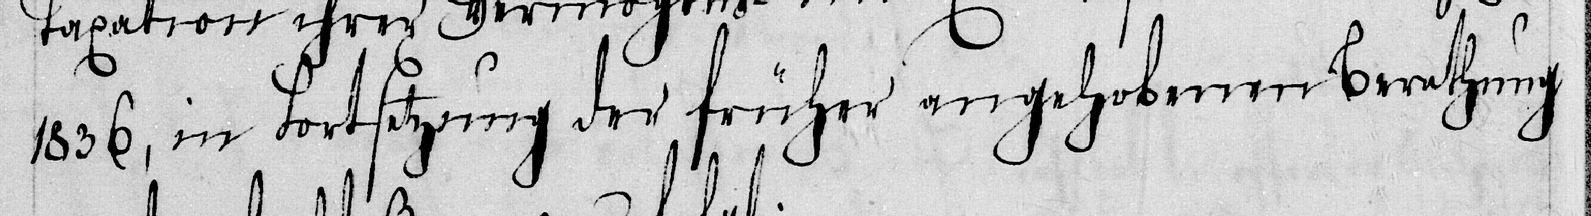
1836, in Fortsetzung der früher angehobenen Berathung
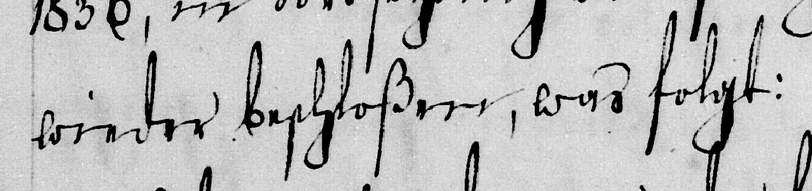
wieder beschloßen, was folgt:
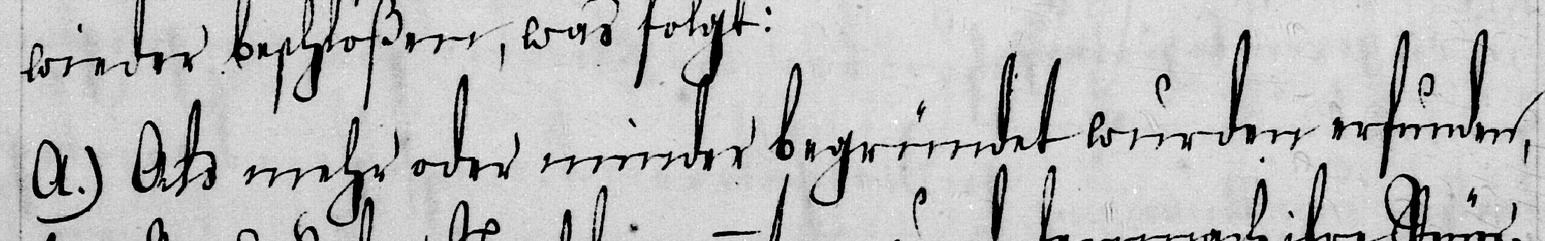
A.) Als mehr oder minder begründet wurden erfunden,
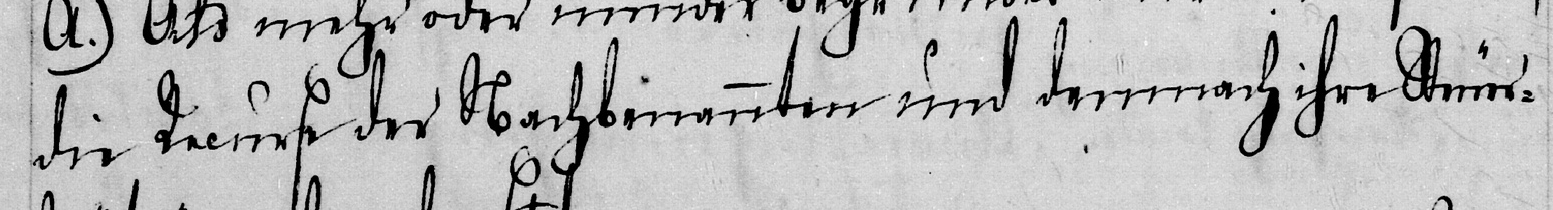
die Recurse der Nachbenannten und demnach ihre Steuer¬
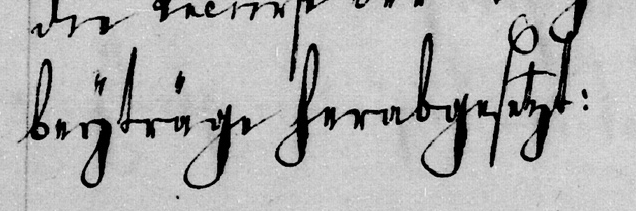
beyträge herabgesetz¬
